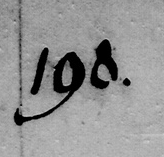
1836.
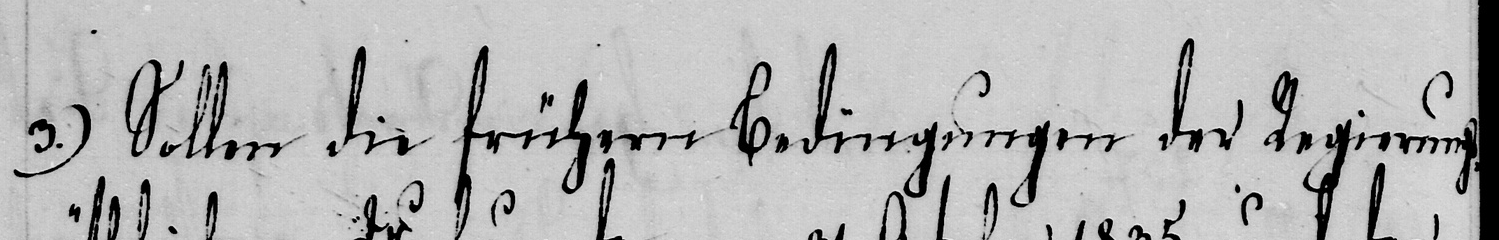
3.) Sollen die frühern Bedingungen der Regierun¬
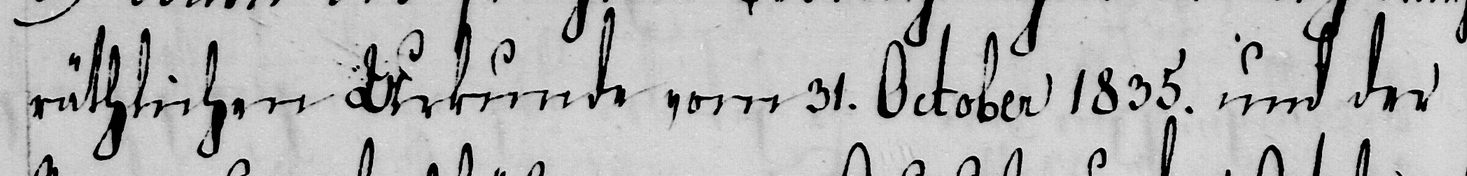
räthlichen Urkunde vom 31. October 1835. und der
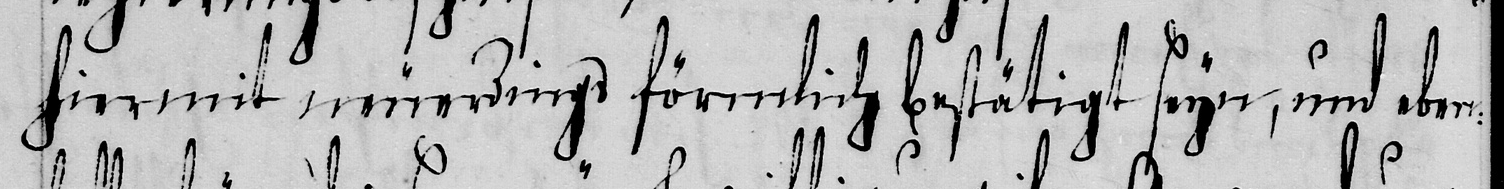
hiermit neuerdings förmlich bestätigt seyn, und eben¬
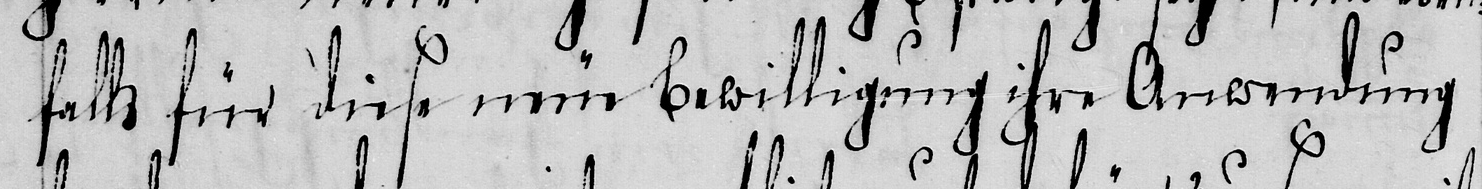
falls für diese neue Bewilligung ihre Anwendung
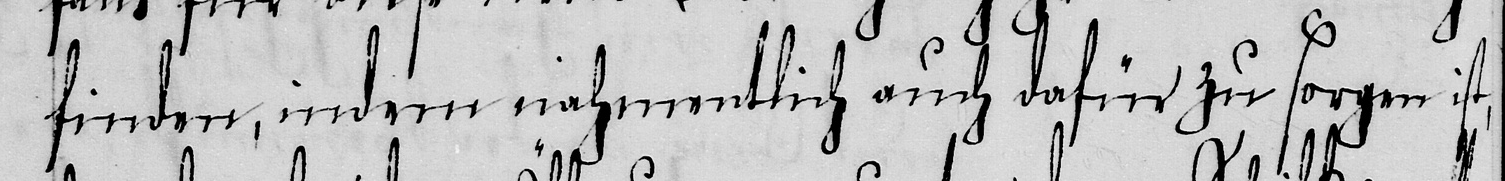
finden, indem nahmentlich auch dafür zu sorgen i¬
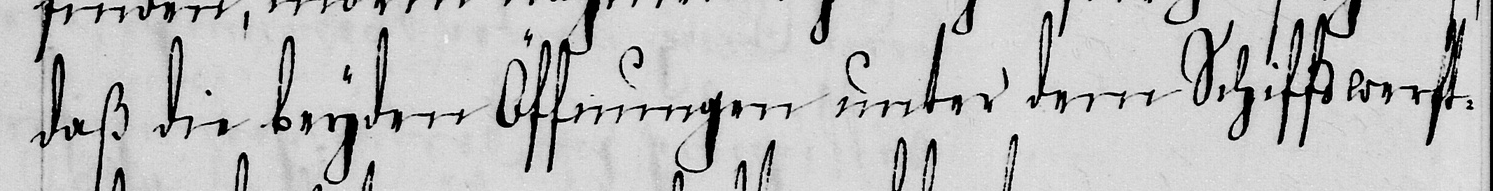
daß die beyden Öffnungen unter dem Schiffswerf¬
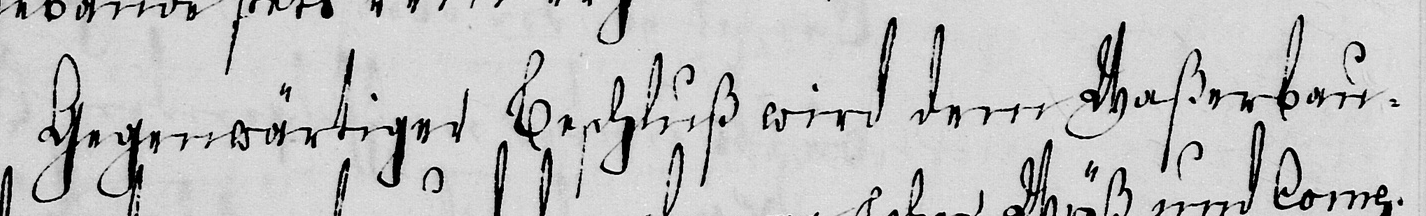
Gegenwärtiger Beschluß wird dem Waßerbau¬
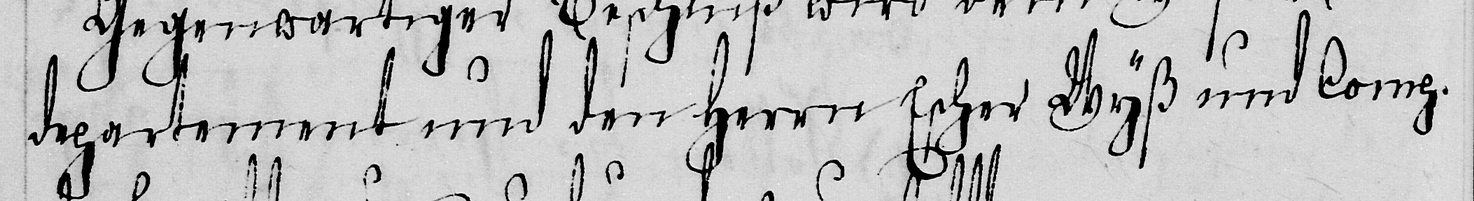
departement und den Herrn Escher Wyß und Comp.
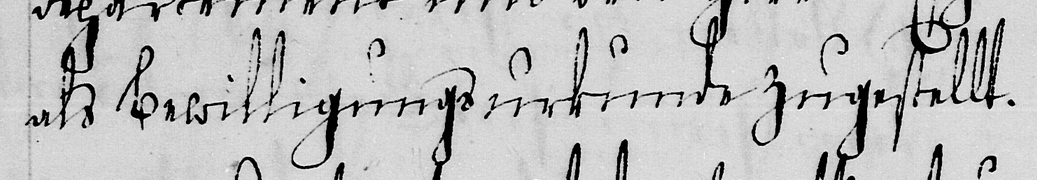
als Bewilligungsurkunde zugestellt.
